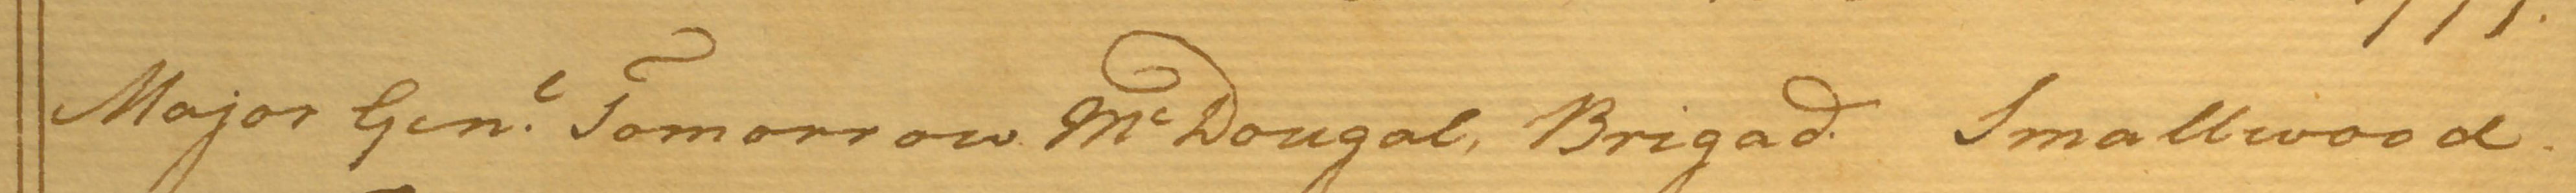Major Gen^l. Tomorrow M^cDougal, Brigad. Smallwood
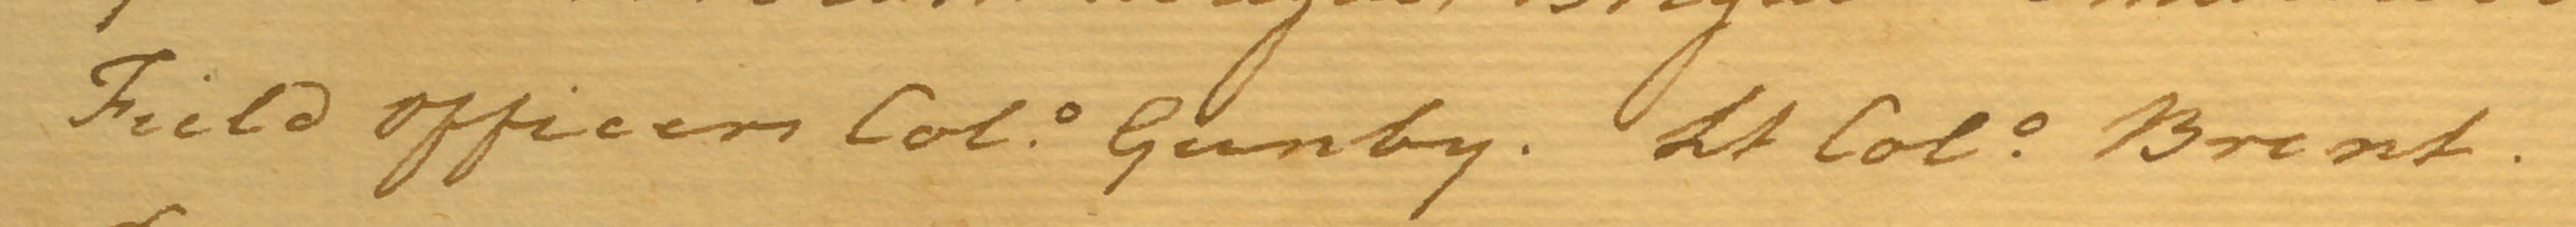Field Officers Col^o. Gunby. Lt Col^o. Brent.
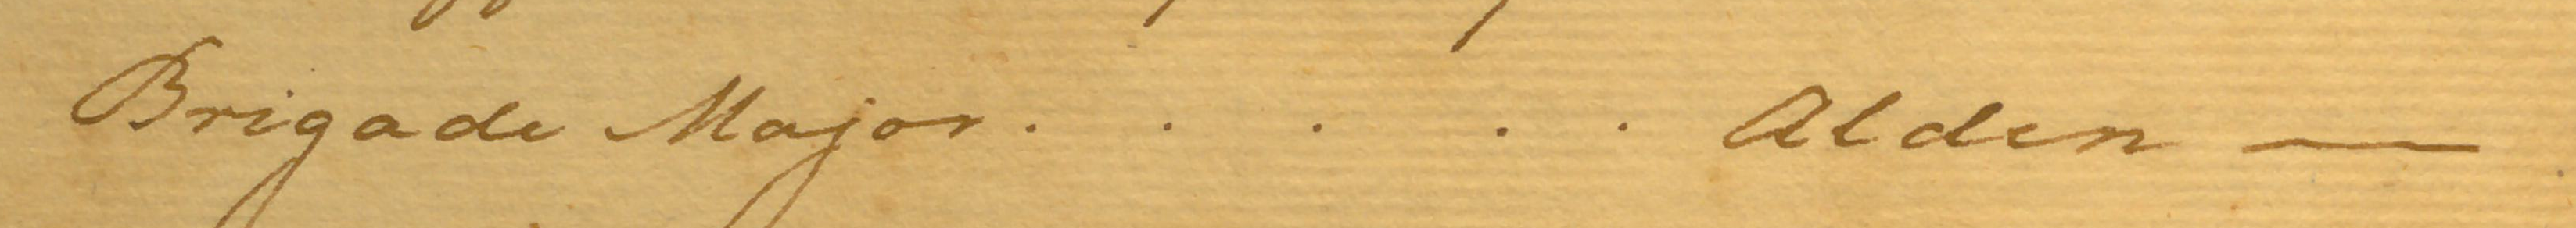Brigade Major. .... Alden-
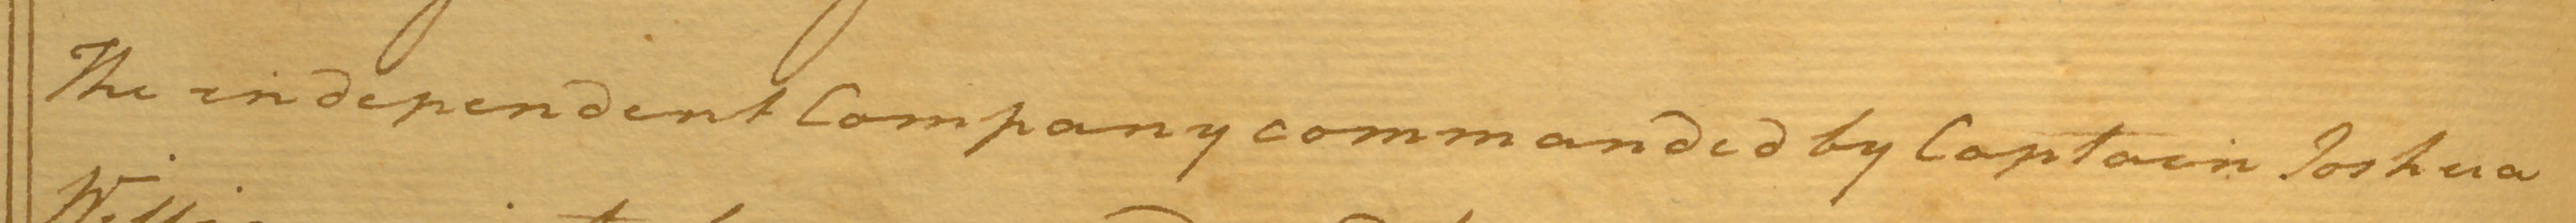The independent Company commanded by Captain Joshua
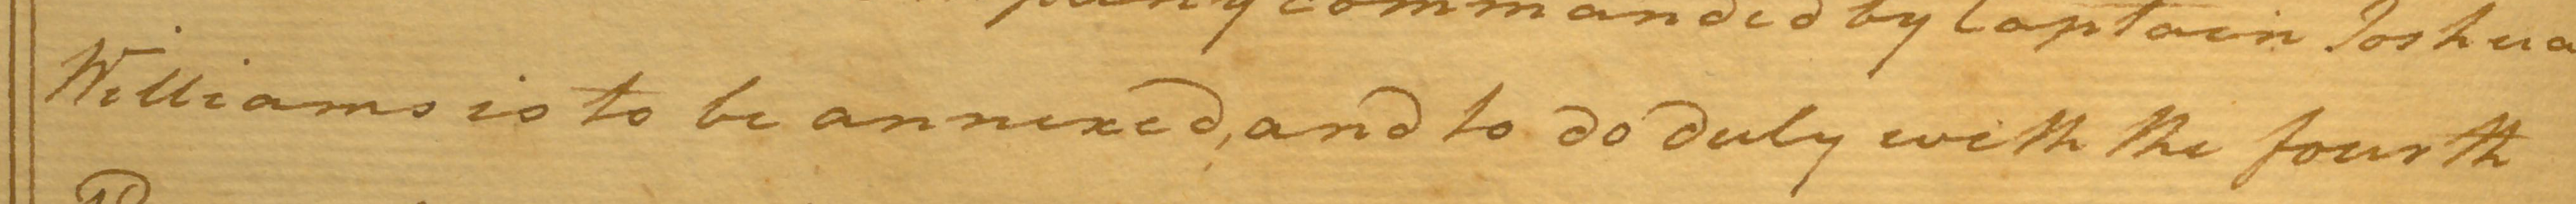Williams is to be annexed, and to do duty with the fourth
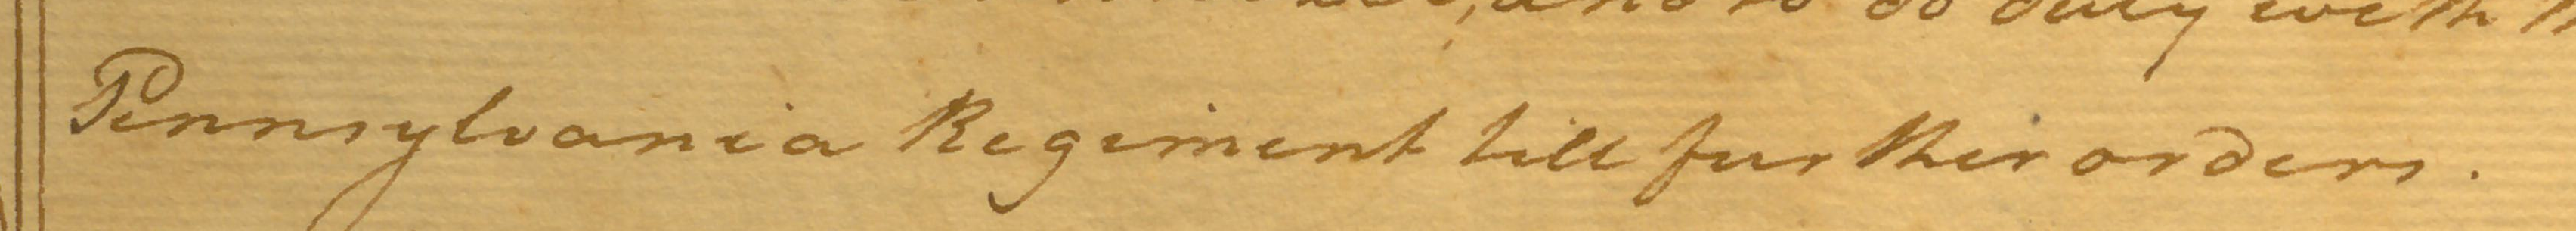Pennsylvania Regiment till further orders.
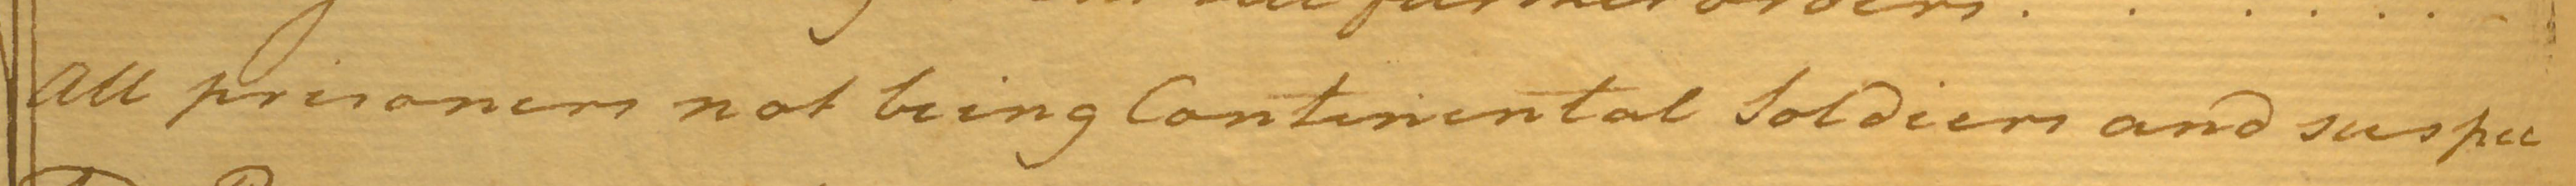All prisoners not being Continental Soldiers and suspec
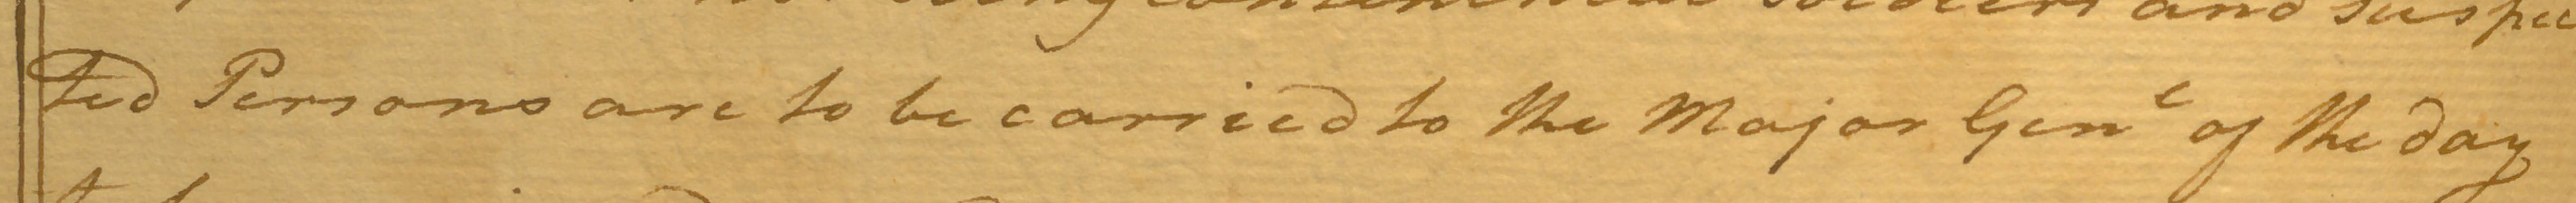ted Persons are to be carried to the Major Gen^l of the day
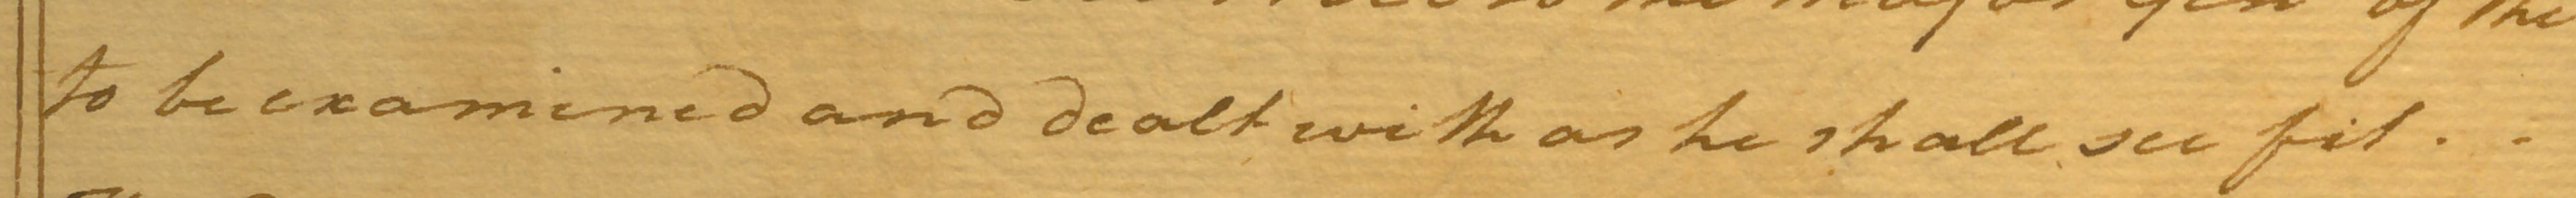to be examined and dealt with as he shall see fit..
